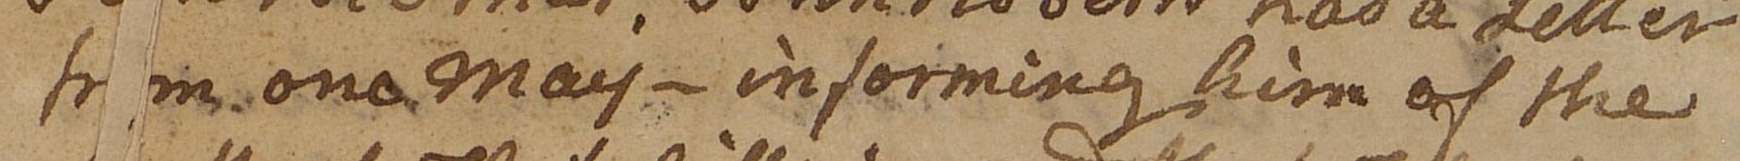[from] one May- informing him of the
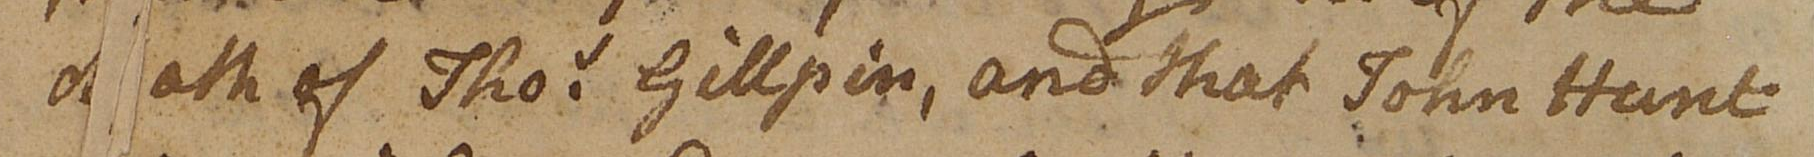[death] of Tho^s. Gillpin, and that John Hunt
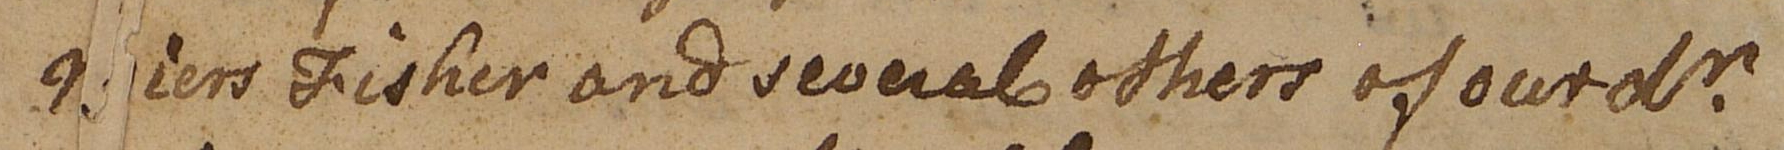[M]iers Fisher and several others of our d^r.
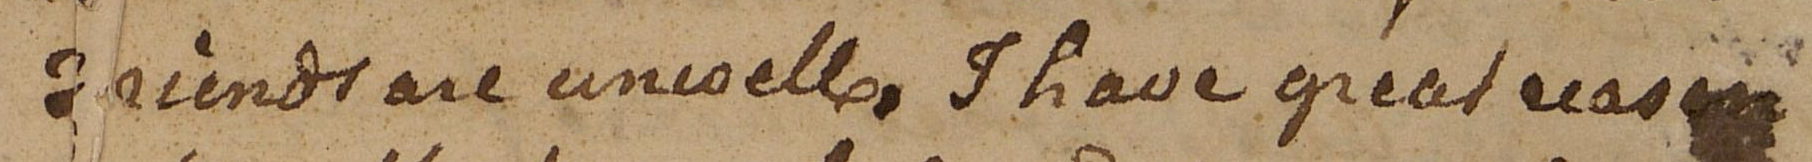Friends are unwell, I have great reason
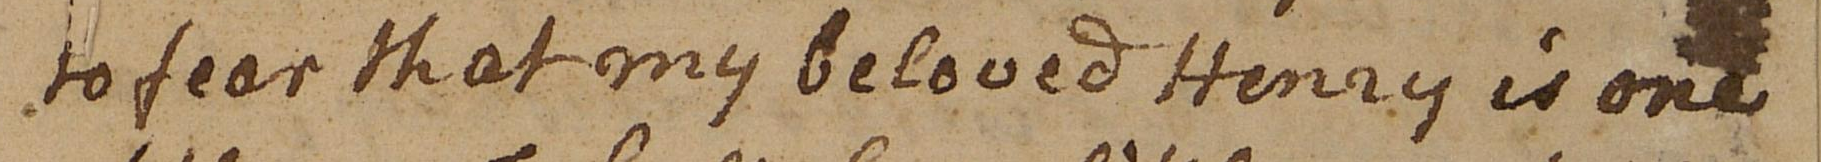to fear that my beloved Henry is one
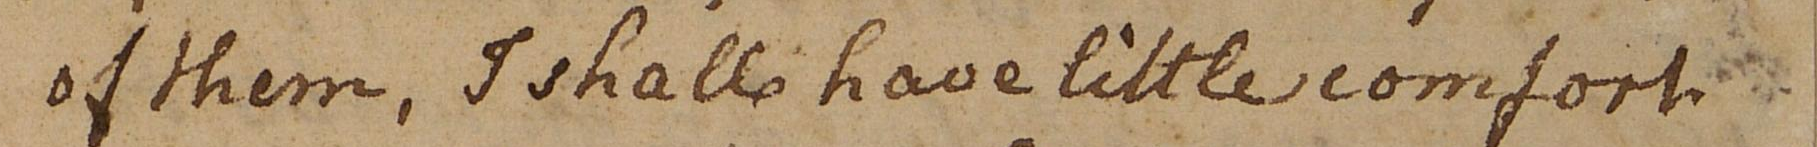of them, I shall have little comfort
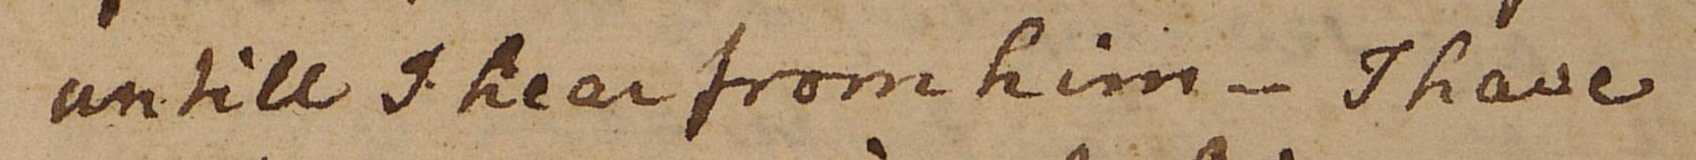untill I hear from him- I have
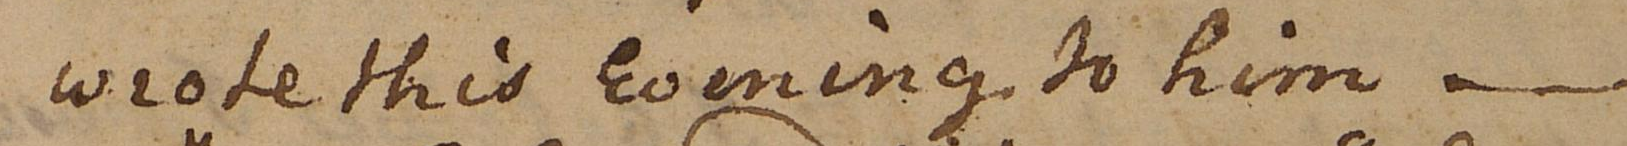wrote this Evening to him-
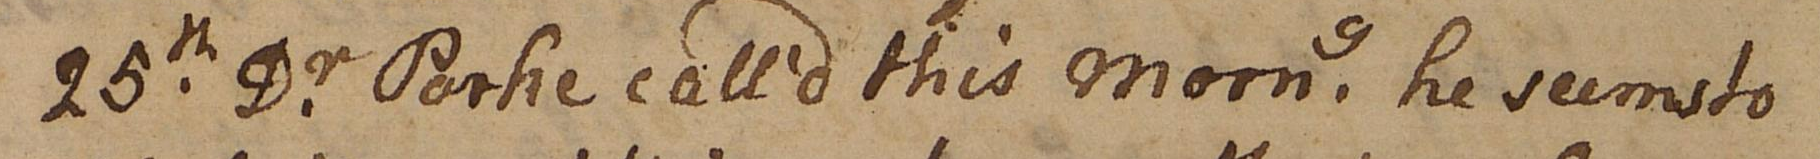25^th. D^r. Parke call'd this morn^g. he seems to
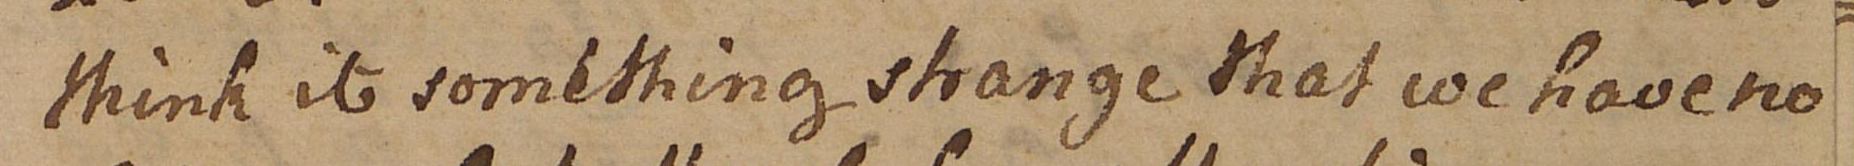think its something strange that we have no
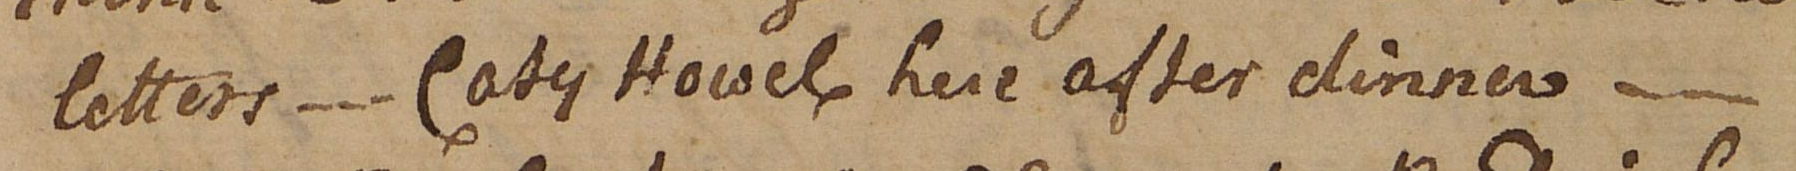letters- Caty Howel here after dinner-
